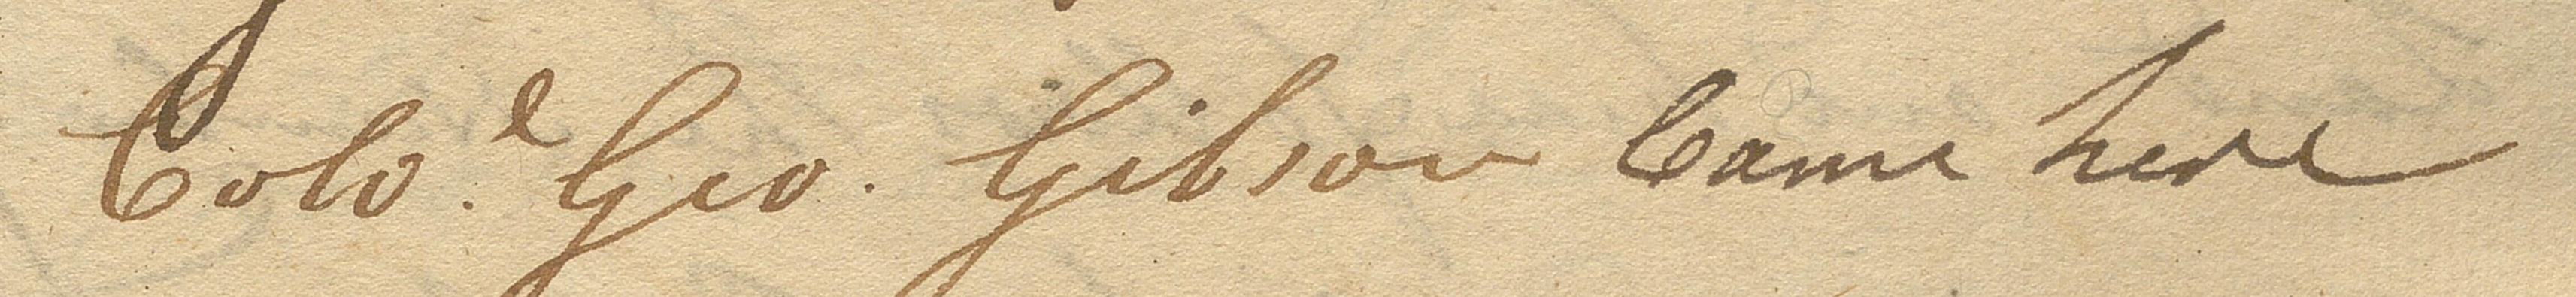Colo^l. Geo. Gibson Came here
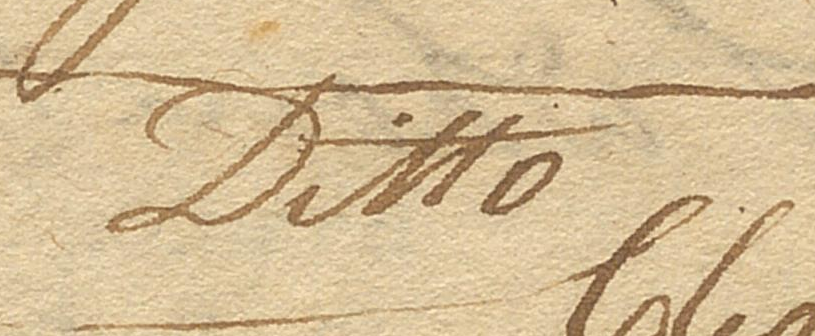Ditto
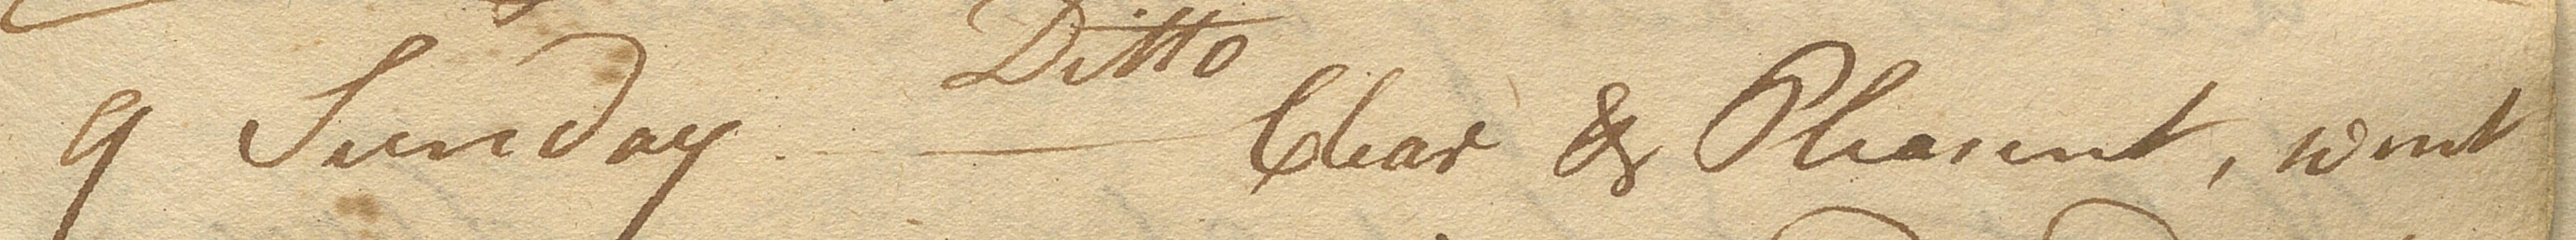9 Sunday- Clear & Pleasent, went
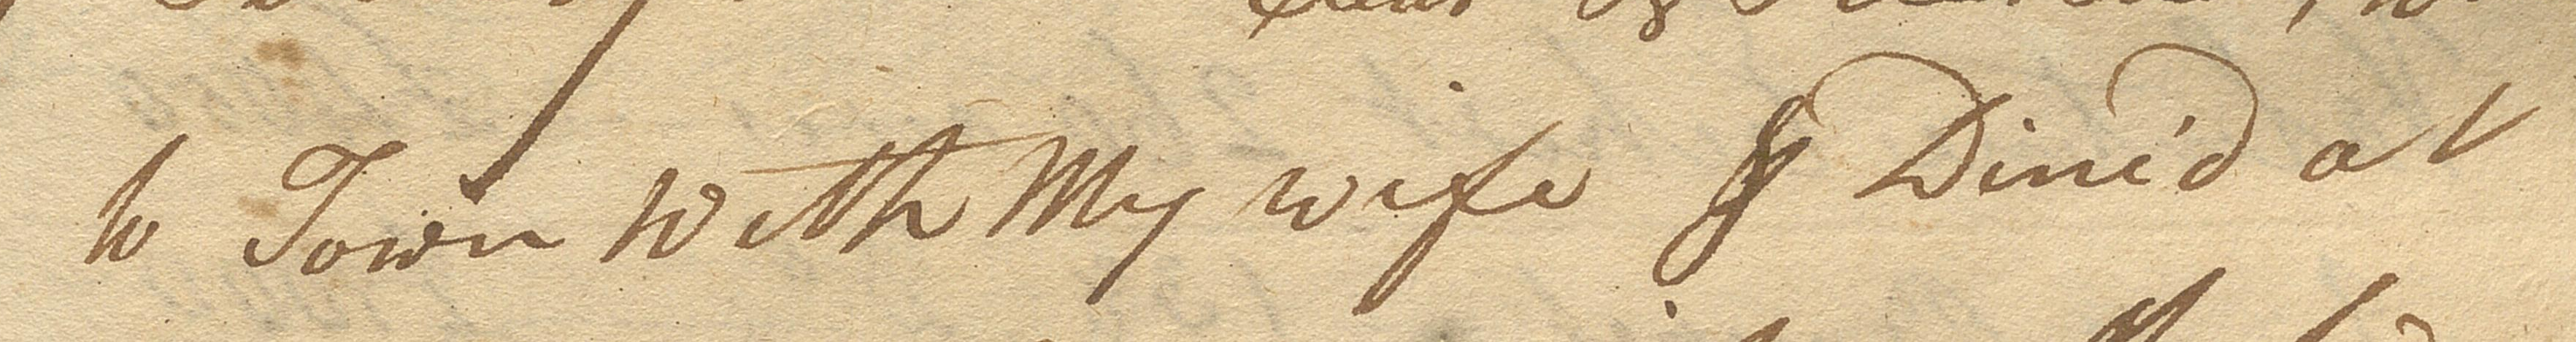to Town with My wife I Dine'd at
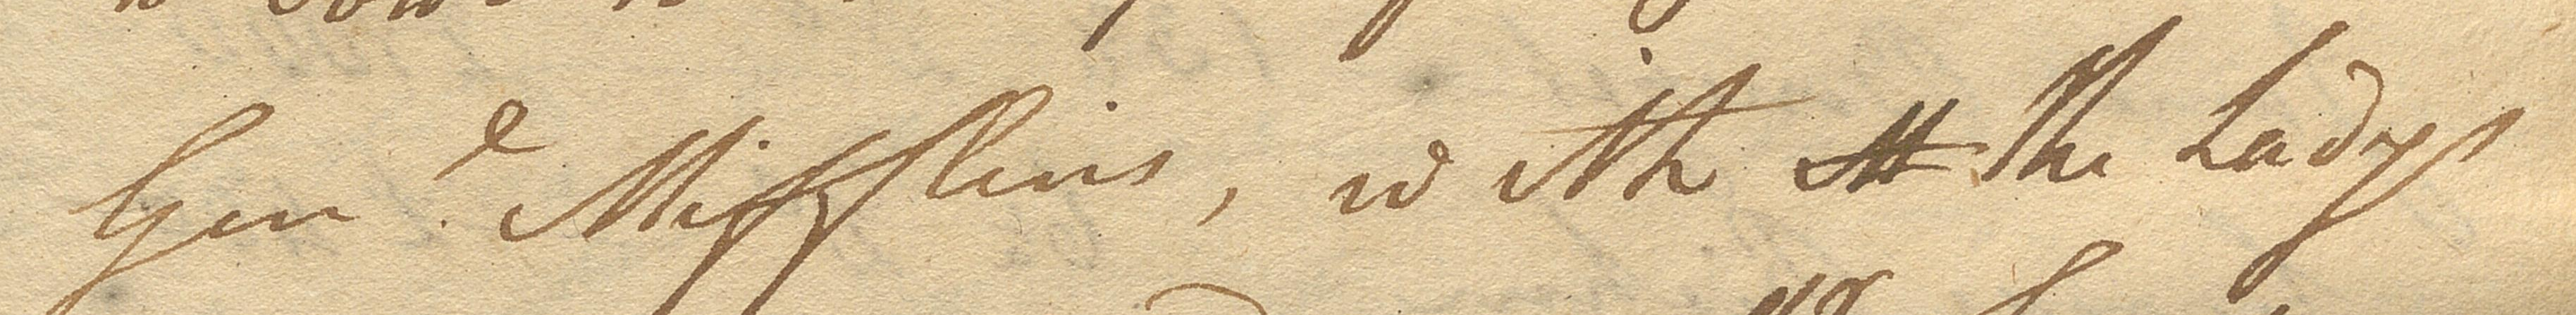Gen^l. Mifflins, with [__] the Ladys
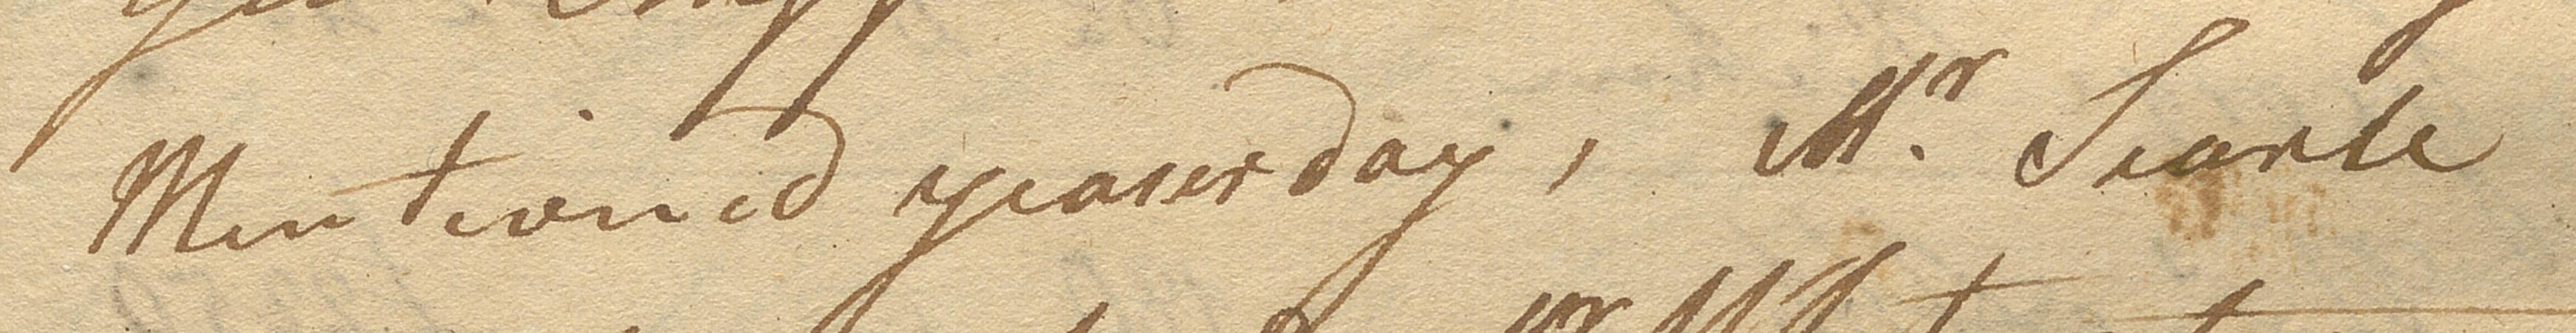Mentioned yeaserdays M^r. Searle
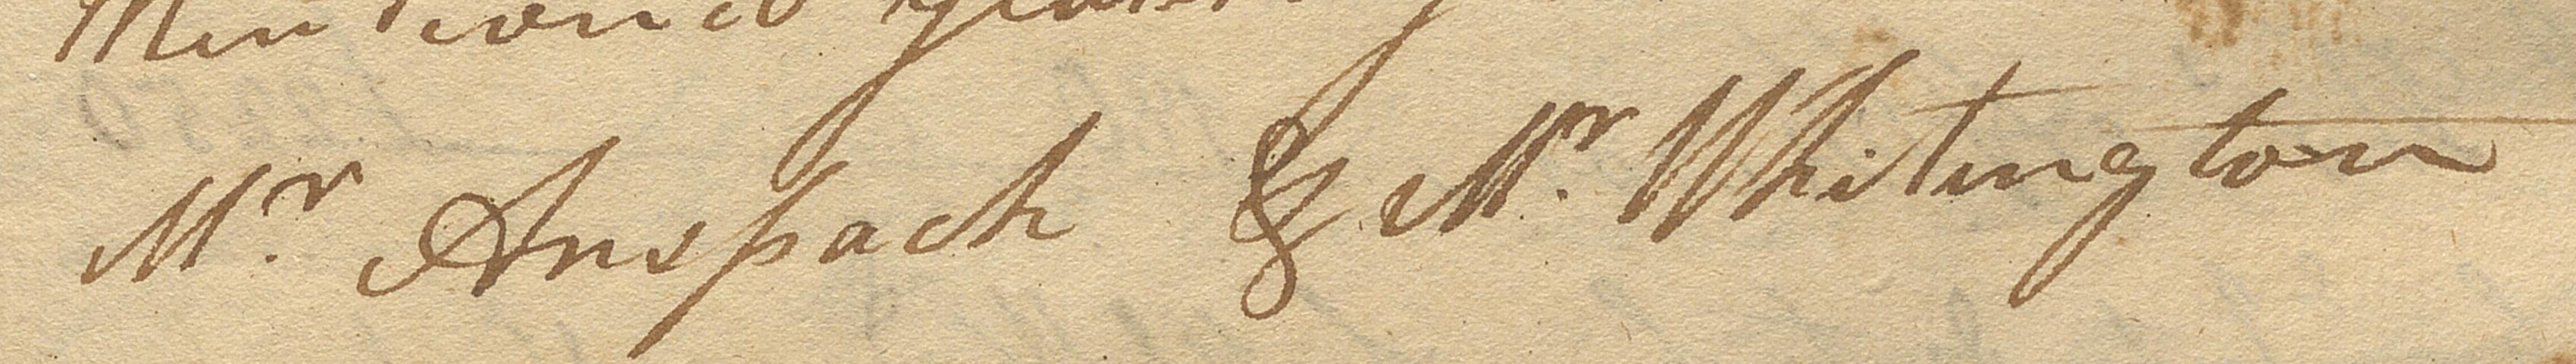M^r. Anspack & M^r. Whitington
